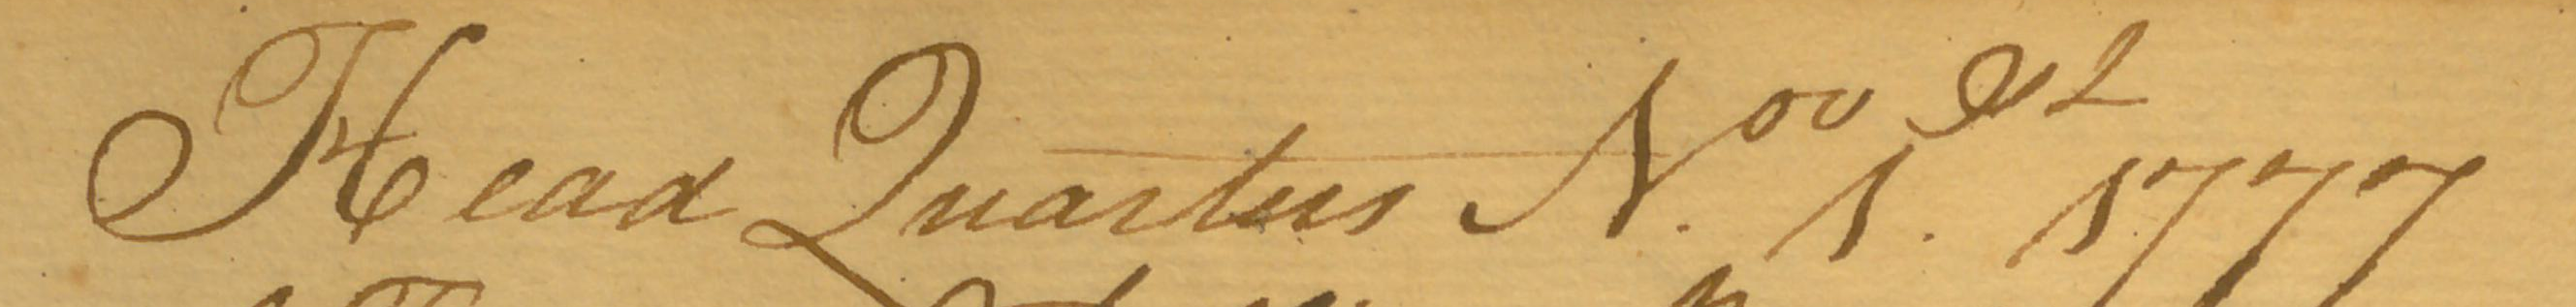Head Quarters N^ov. 1^st. 1777
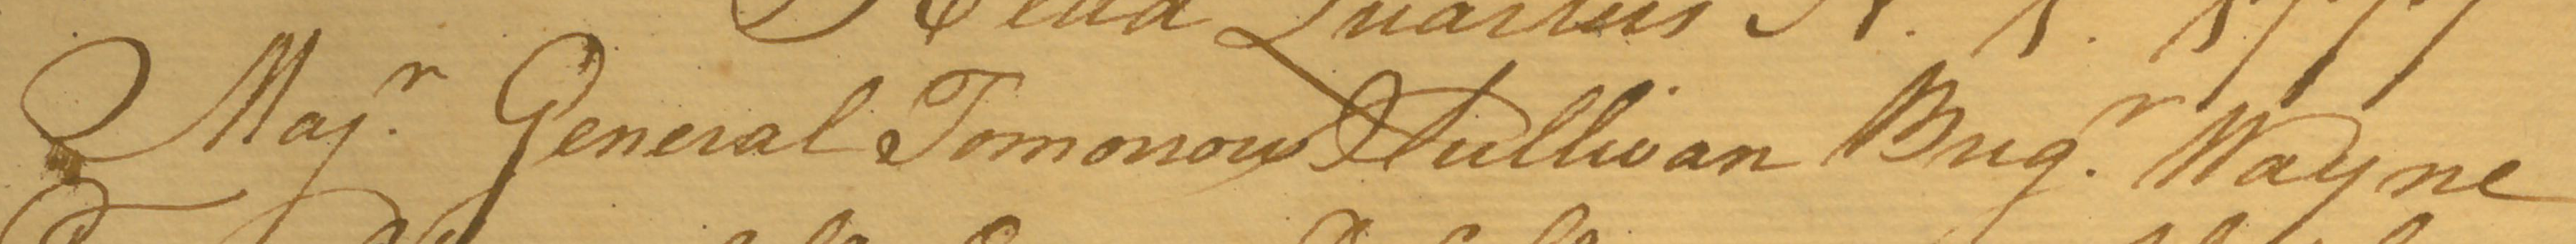Maj^r. General Tomorrow Sullivan Brig^r. Wayne
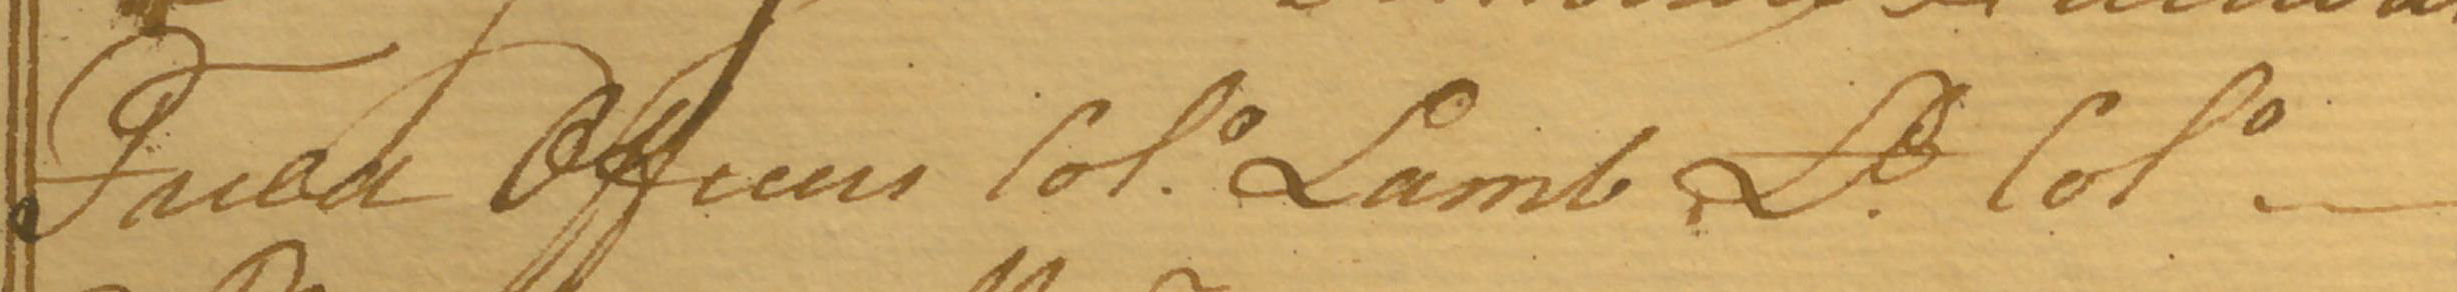Field Officers Col^O. Lamb L^t. Col^o-
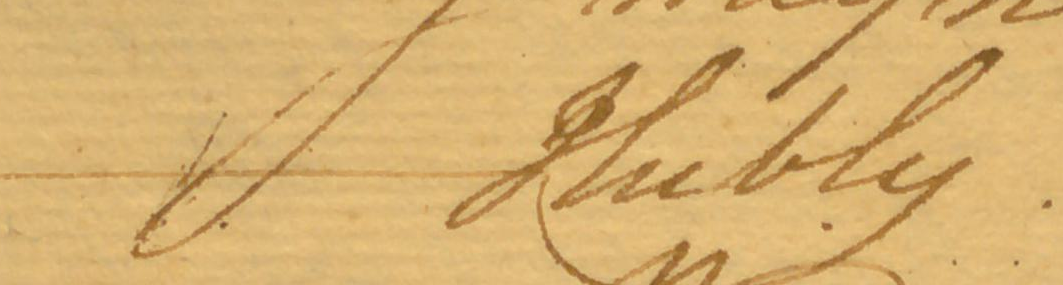Hubly
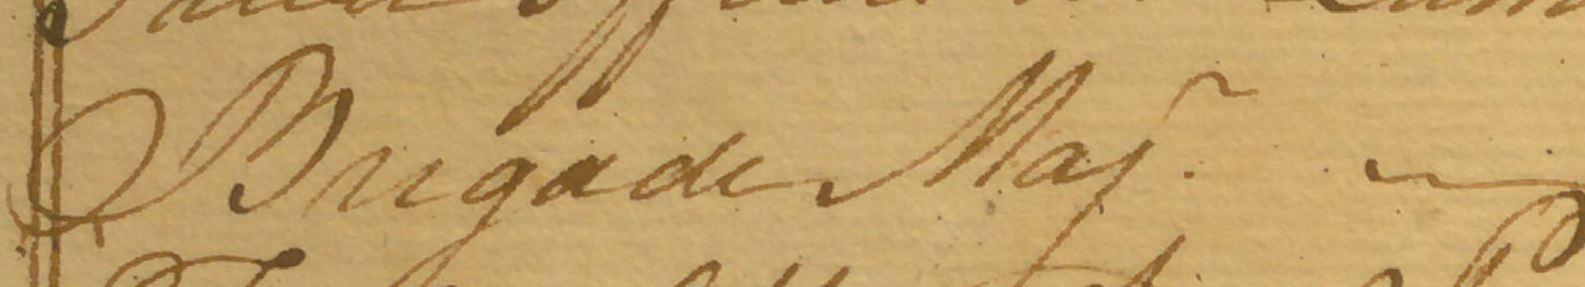Brigade Maj^r. -
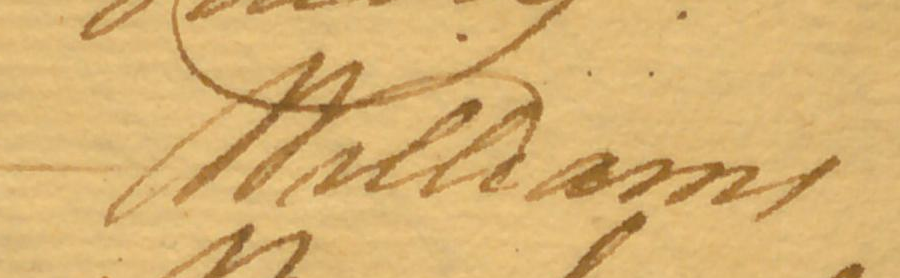Williams
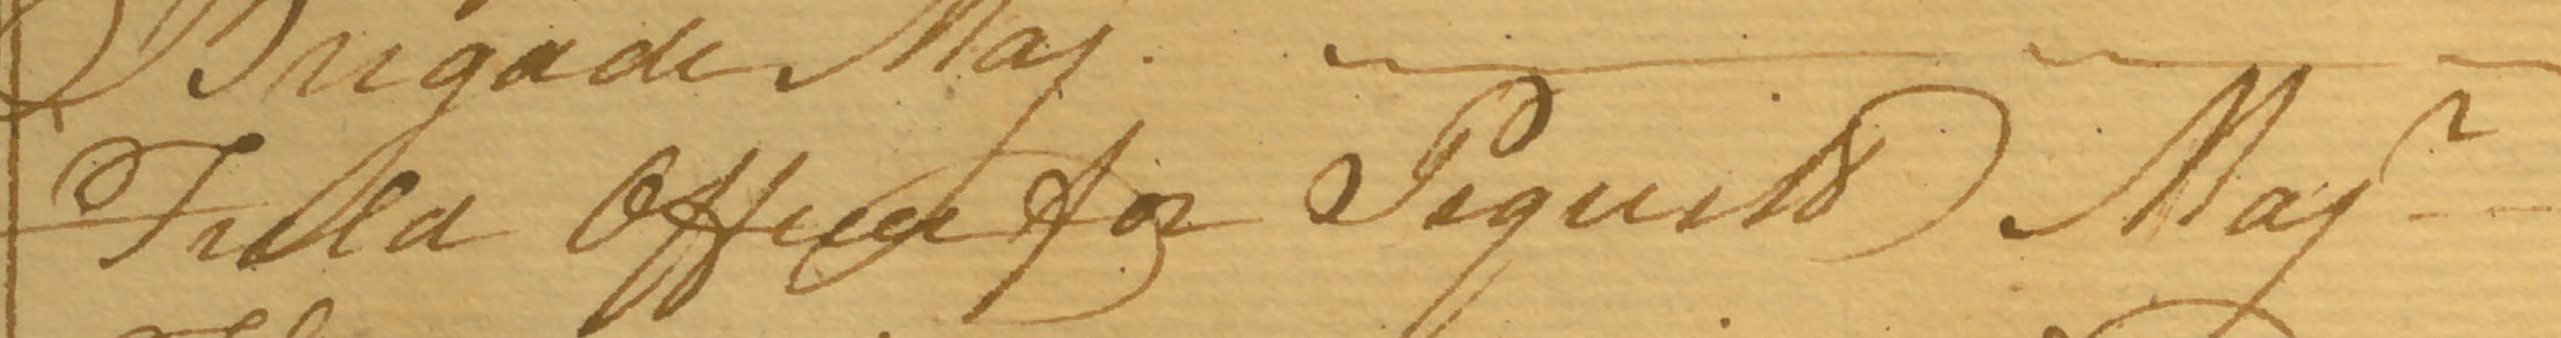Field Officer for Picquets Maj^r.
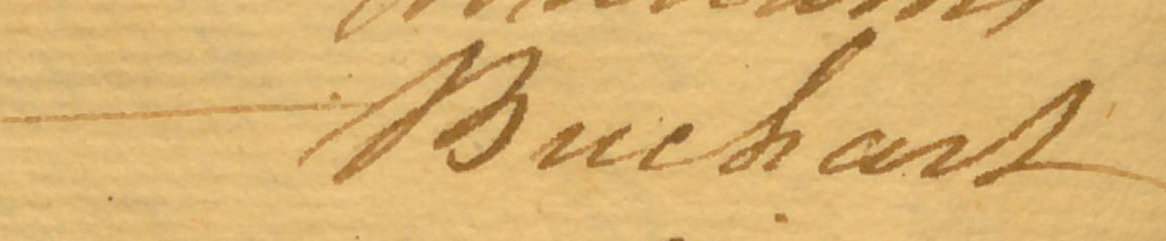Buchart
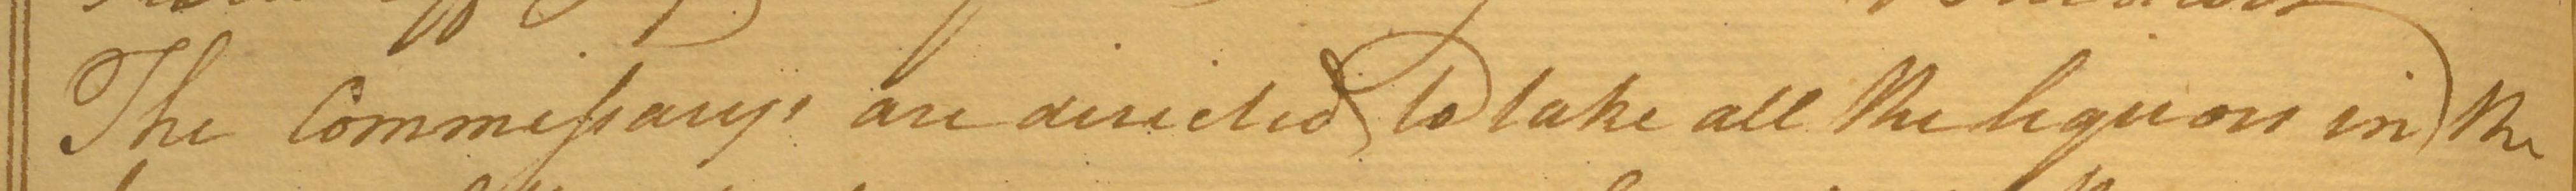The Commissarys are directed to take all the liquors in the
